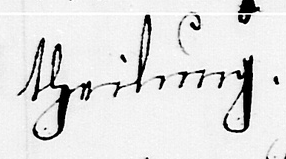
theilung.
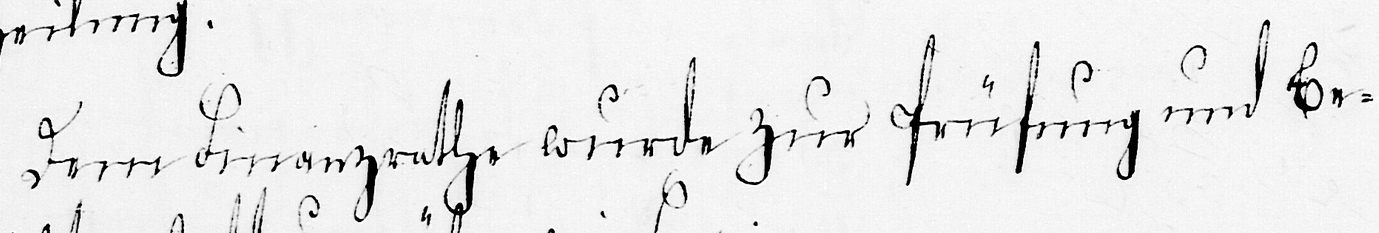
Dem Finanzrathe wurde zur Prüfung und Be¬
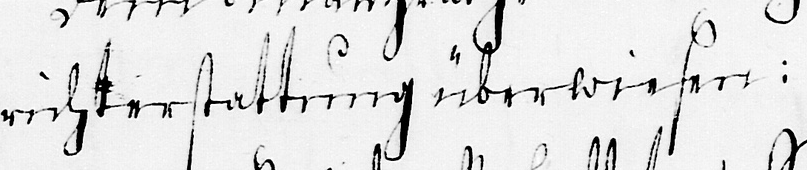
richterstattung überwiesen:
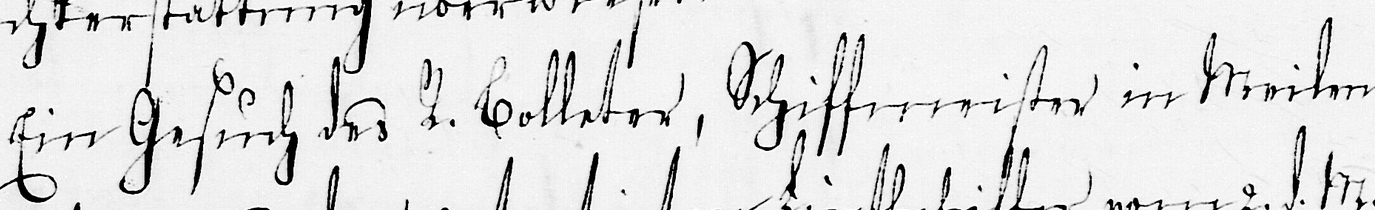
Ein Gesuch des R. Bolleter, Schiffmeister in Meilen,
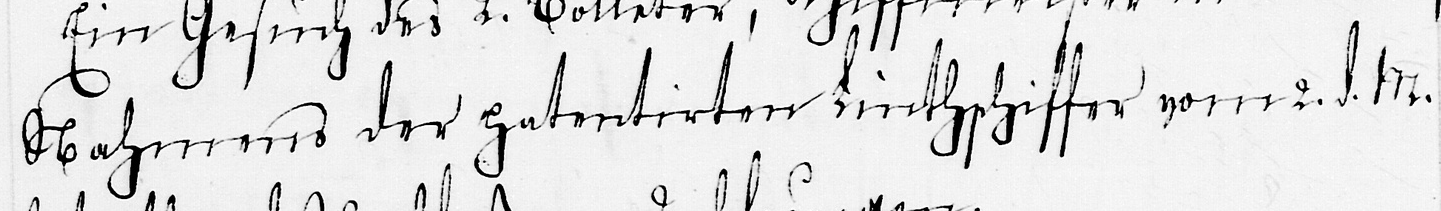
Nahmens der patentirten Linthschiffer vom 2. d. M.
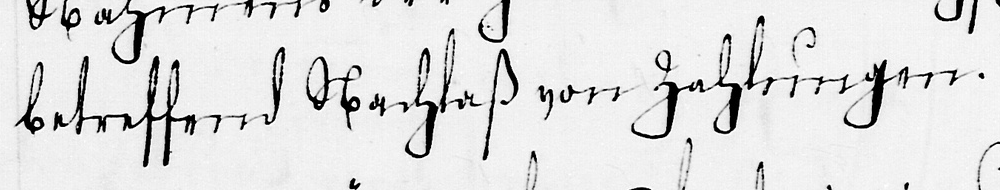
betreffend Nachlaß von Zahlungen.
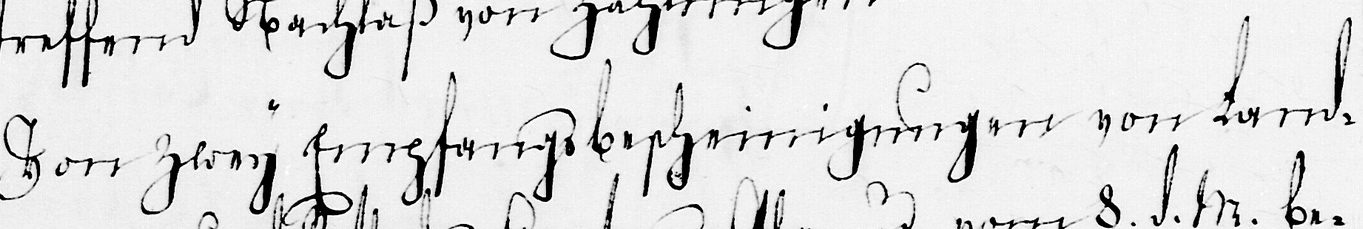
Von zwey Empfangsbescheinigungen von Land¬
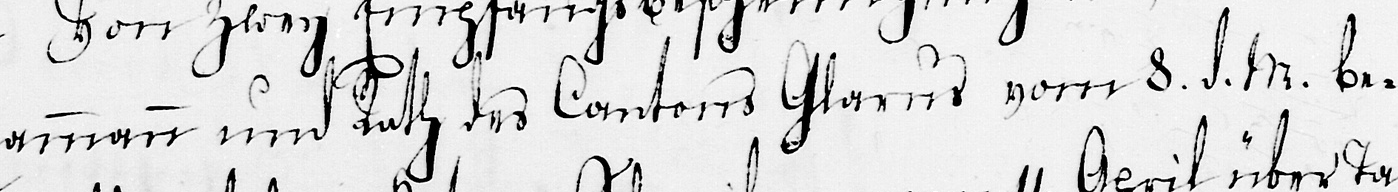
ammann und Rath des Cantons Glarus vom 8. d. M. be¬
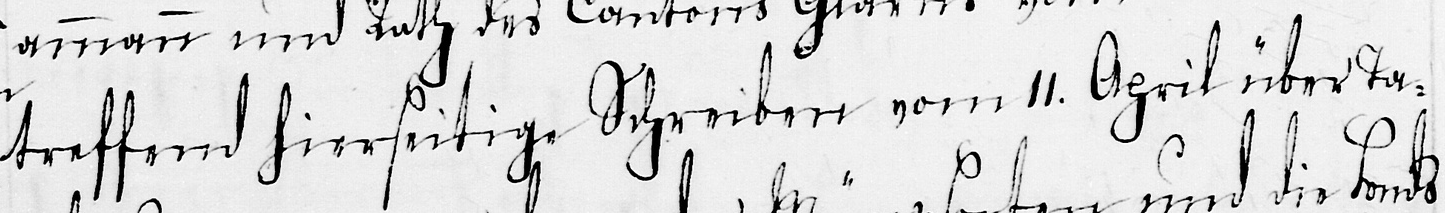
treffend hierseitige Schreiben vom 11. April über Ta¬
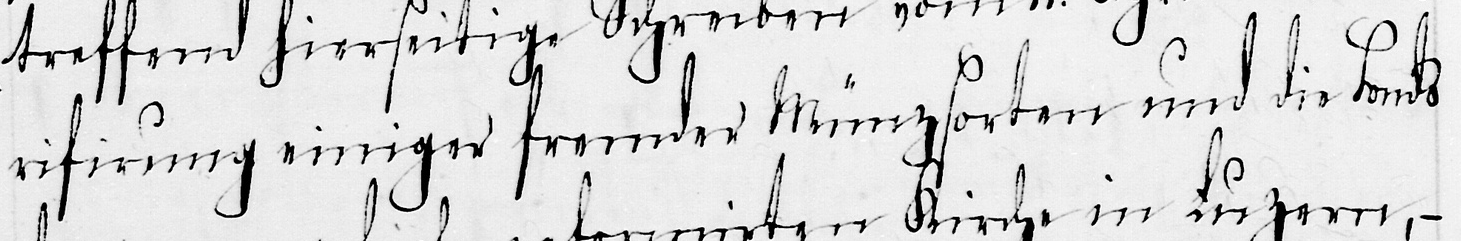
rifirung einiger fremder Münzsorten und die Fonds
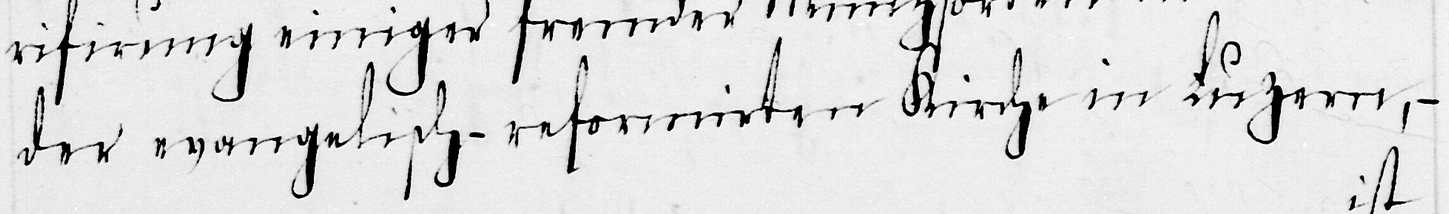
der evangelisch-reformirten Kirche in Luzern, –
